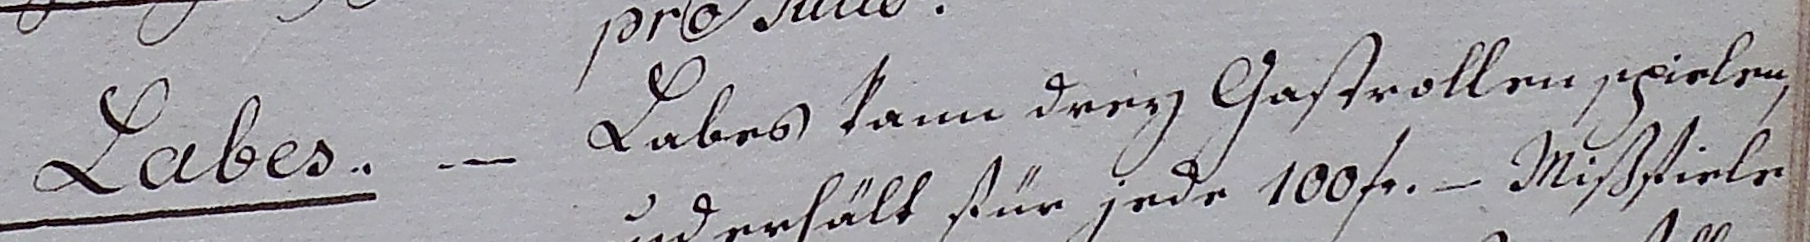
Labes. ... Labes kann drey Gastrollen spielen,
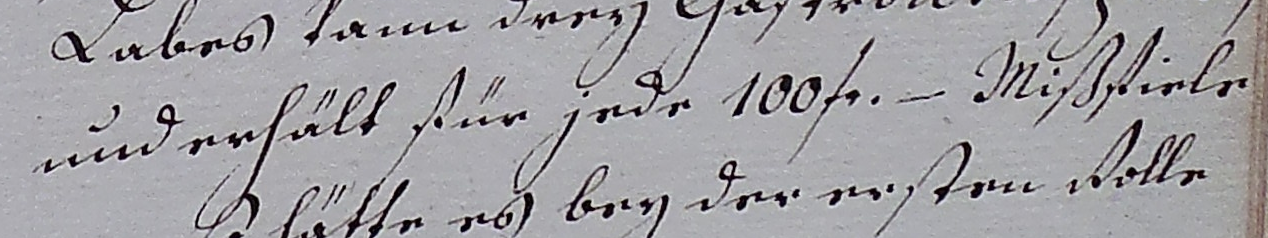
und erhält für jede 100fr. - Mißfiele
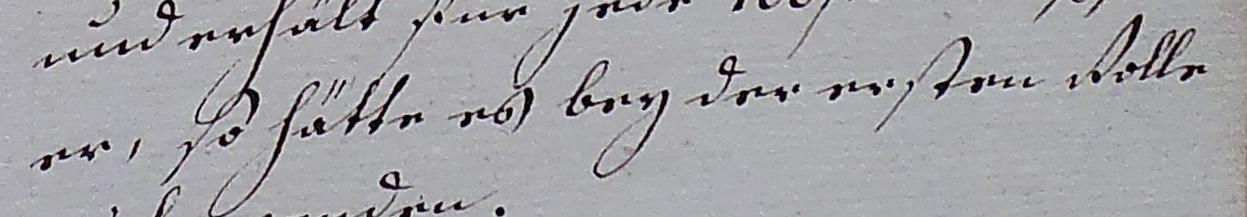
er, so hätte es bey der ersten Rolle
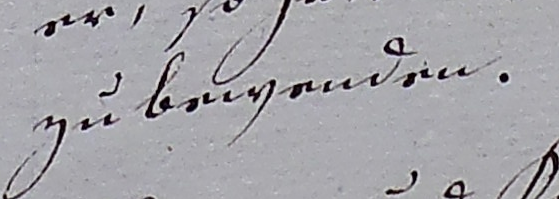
zu bewenden.
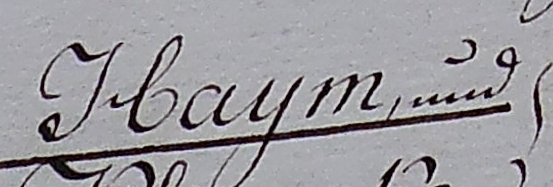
Haym, und
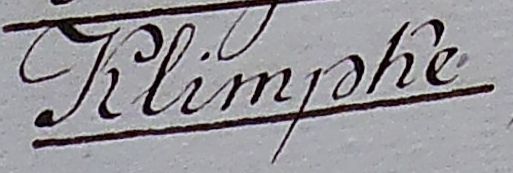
Klimpke
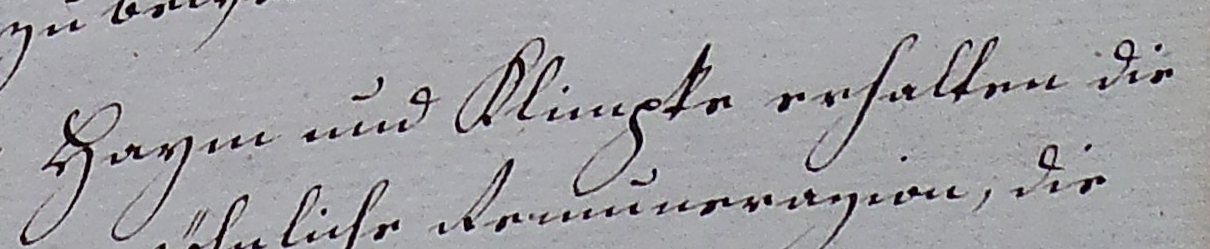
Haym und Klimpke erhalten die
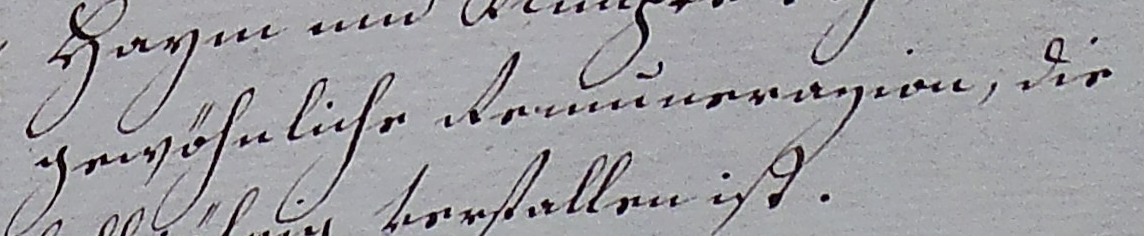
gewöhnliche Remunerazion, die
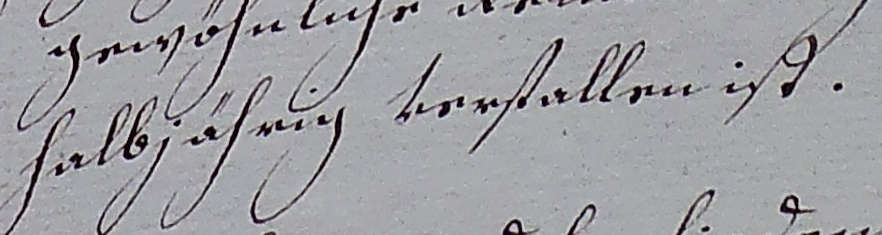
halbjährig verfallen ist.
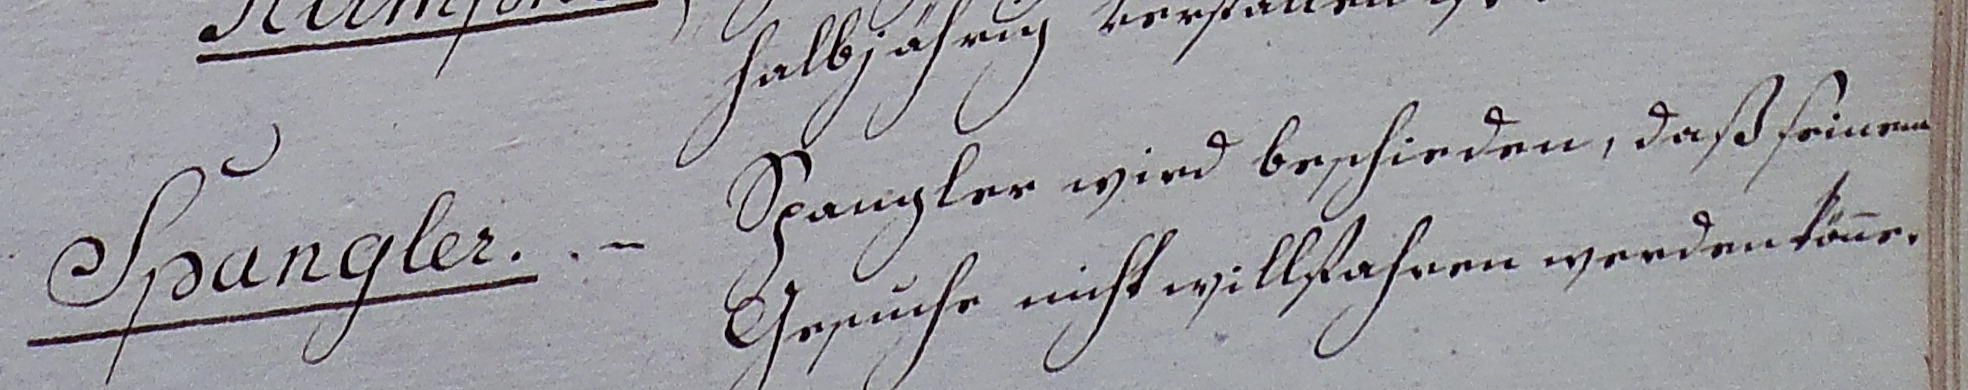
Spangler. . .. Spangler wird beschieden, daß seinem
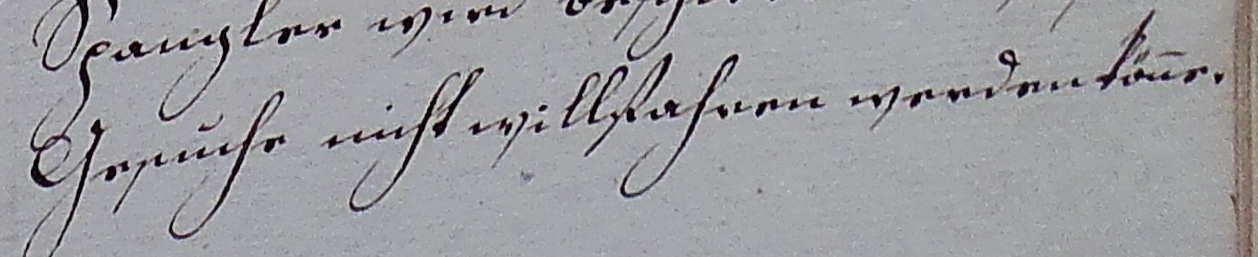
Gesuche nicht willfahren werden kön̅e.
